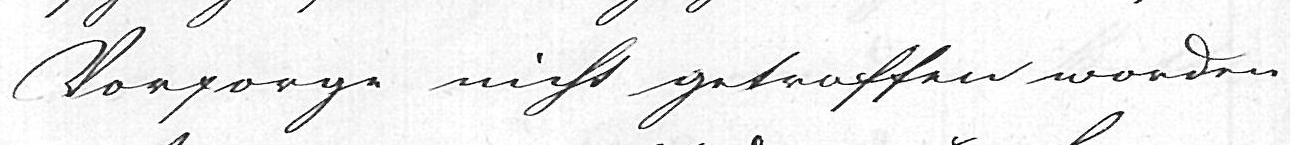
Vorsorge nicht getroffen worden
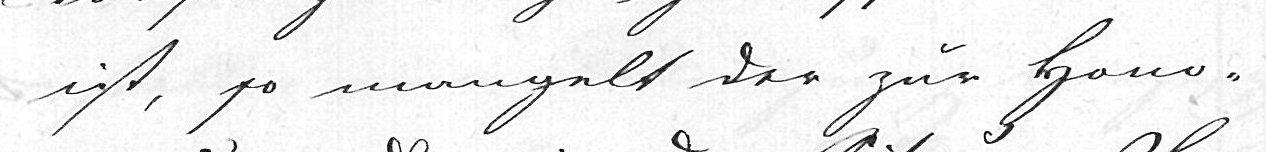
ist, so mangelt der zur Hono-
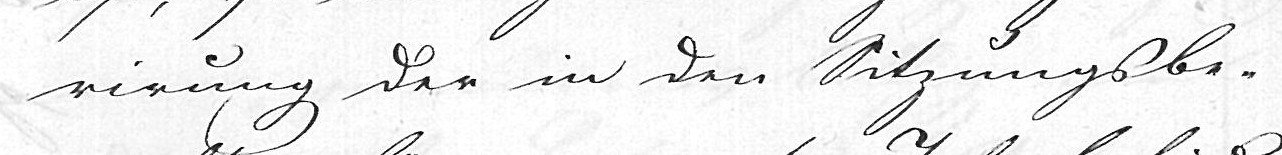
rirung der in den Sitzungsbe-
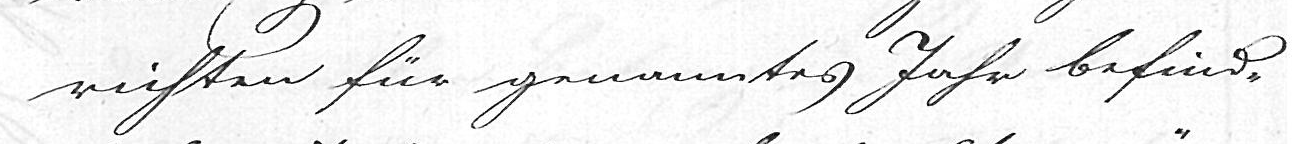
richten für genanntes Jahr befind-
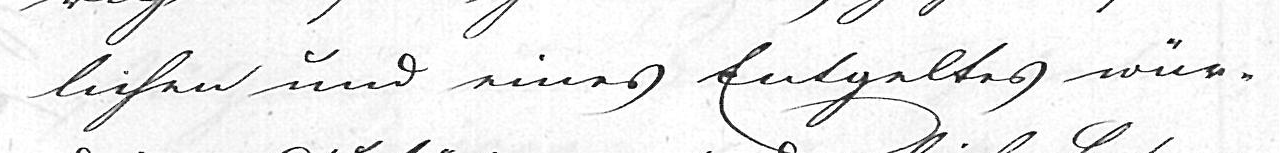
lichen und eines Entgeltes wür-
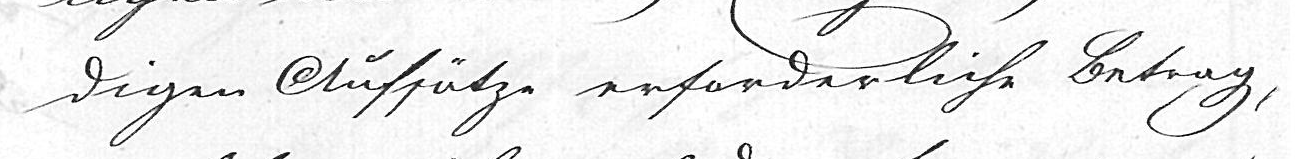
digen Aufsätze erforderliche Betrag,
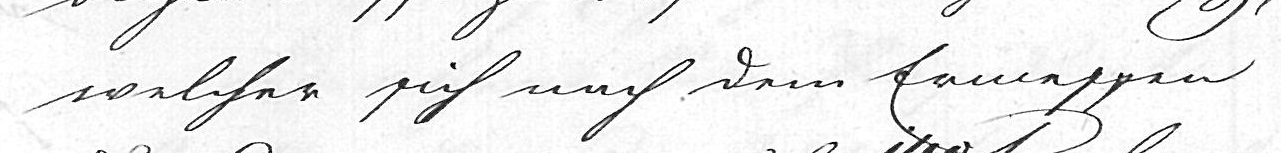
welcher sich nach dem Ermessen
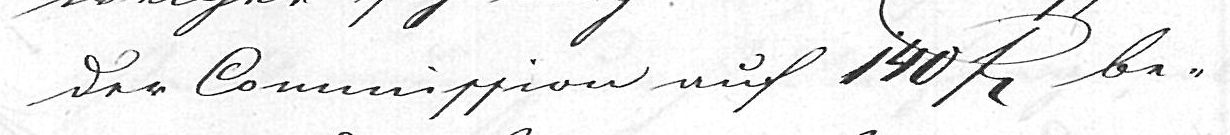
der Commission auf 140 fl be-
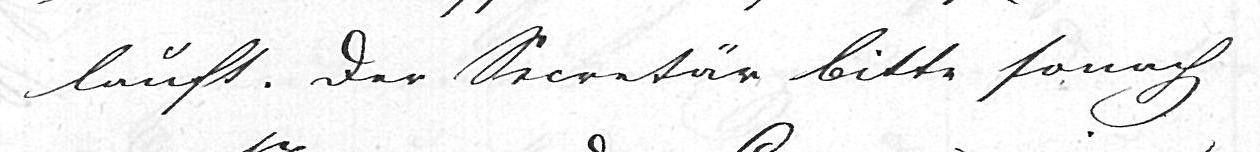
lauft. Der Secretär bitte sonach
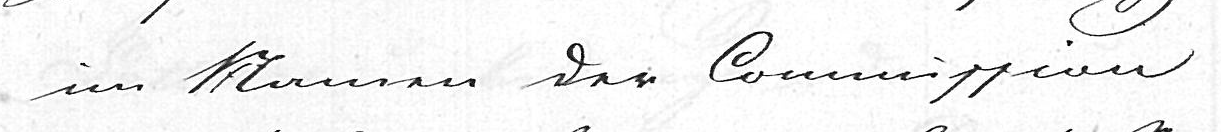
im Namen der Commission
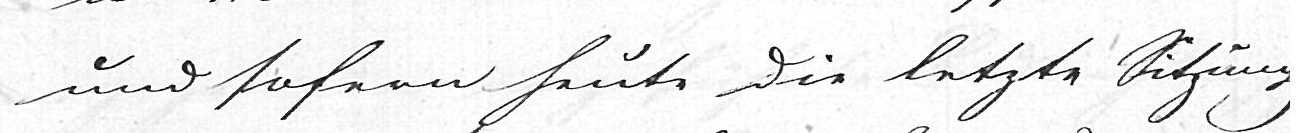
und sofern laute die letzten Sitzung
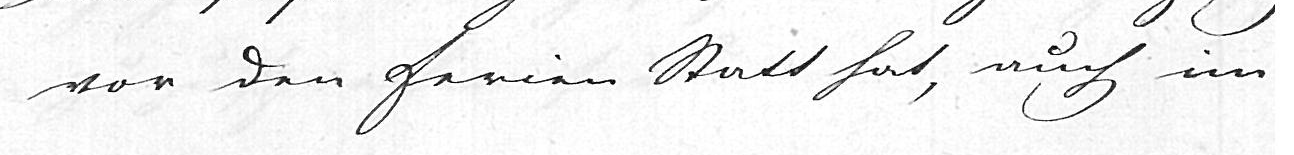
vor den Ferien Statt hat, auch im
